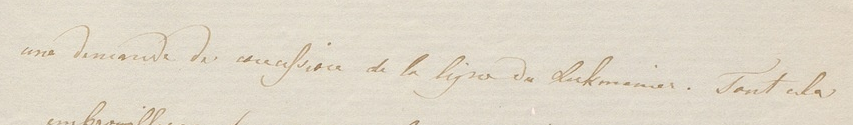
une demande de concession de la ligne du Lukmanier. Tout cela
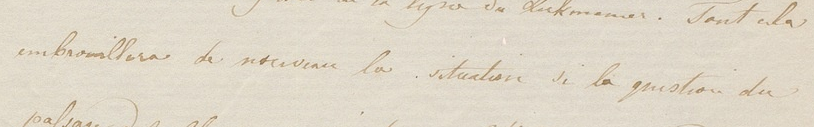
embrouillera de nouveau la situation si la question du
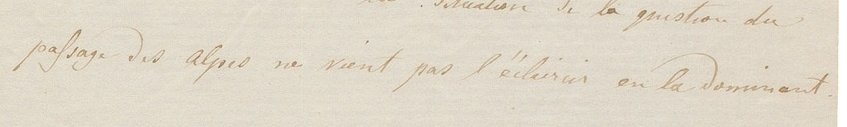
passage des Alpes ne vient pas l'éclaircir en la dominant.
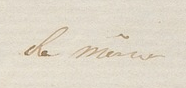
Le même
